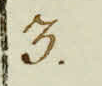3.
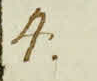4.
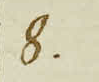8.
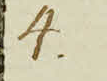4.
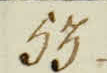53
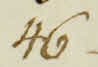46
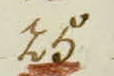25
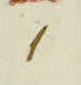1
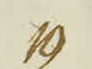19
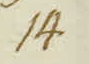14
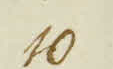10
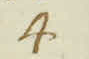4
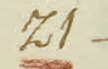21
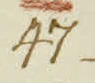47
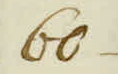60
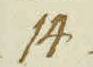14
